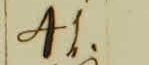41.
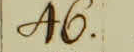46.
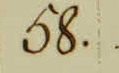58.
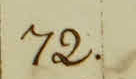72.
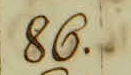86.
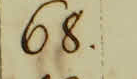68.
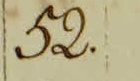52.
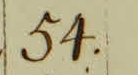54.
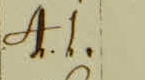41.
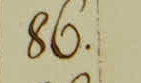86.
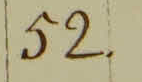52.
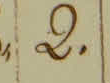2.
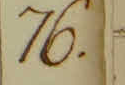76.
